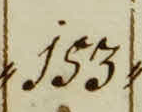153
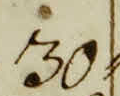30
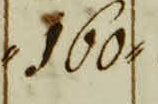160
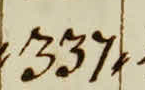337
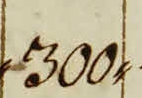300
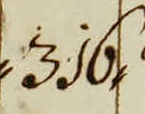316
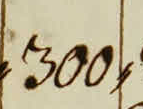300
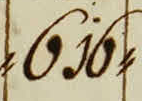616
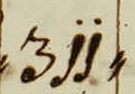311
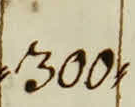300
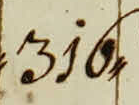316
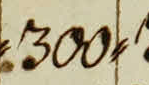300
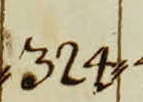324
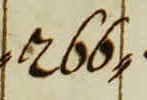266
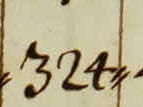324
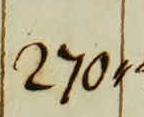270
